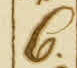6.
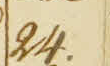24.
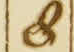8
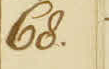68.
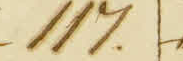117.
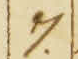7.
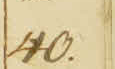40.
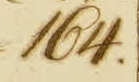164.
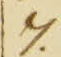7.
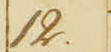12.
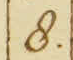8.
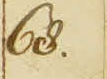68.
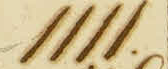1111.
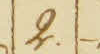2.
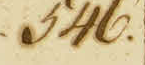546.
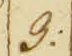3.
